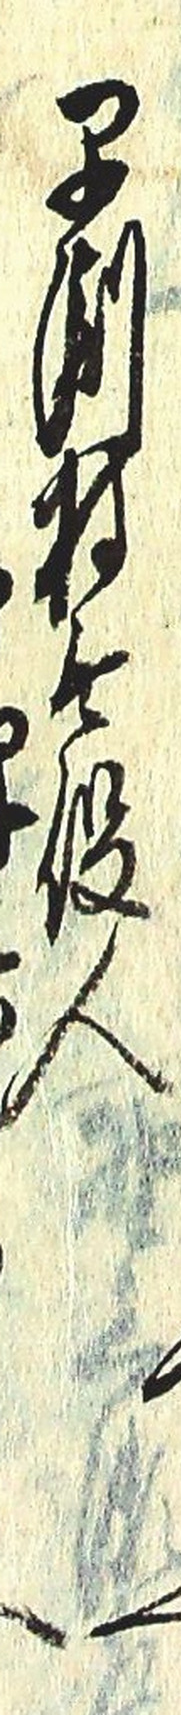早淵村無役人
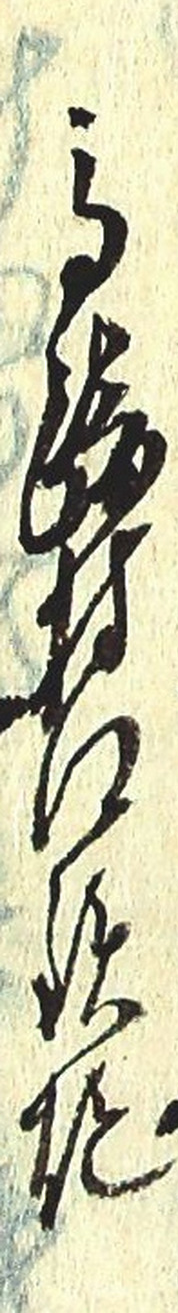高崎村郷鉄炮
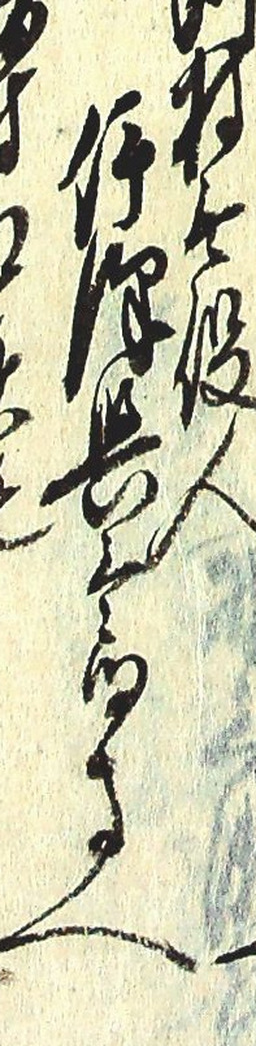伊沢与三郎方へ
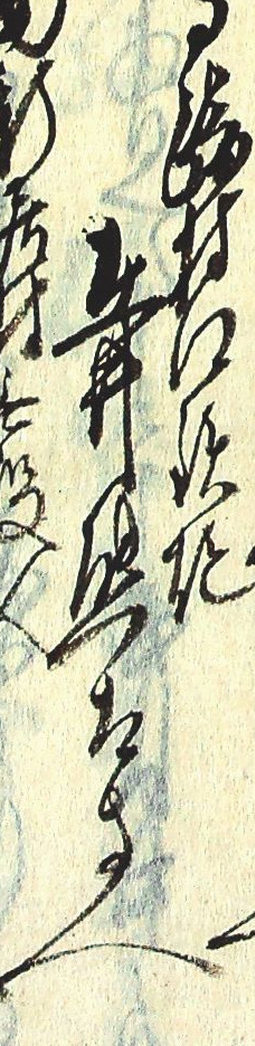在井熊太方へ
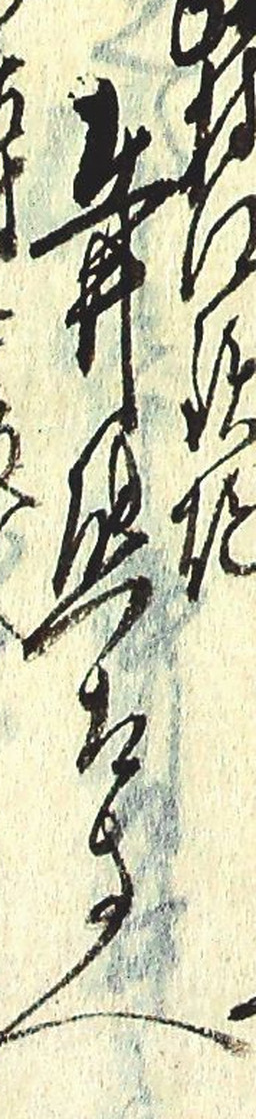在井熊太方へ
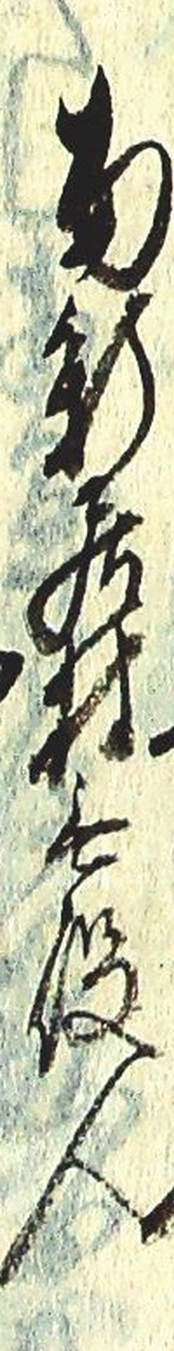南新居村無役人
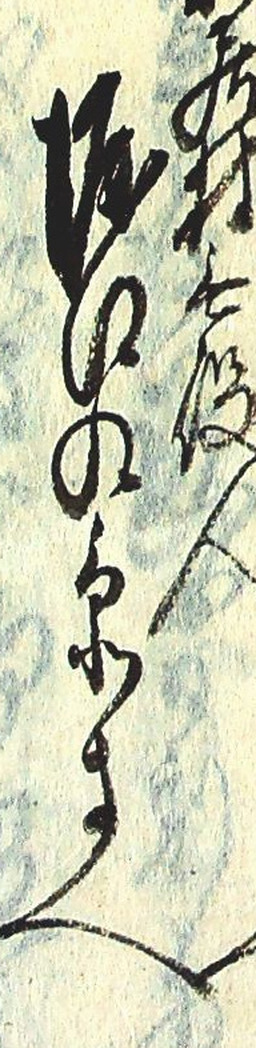堀江九兵衛方へ
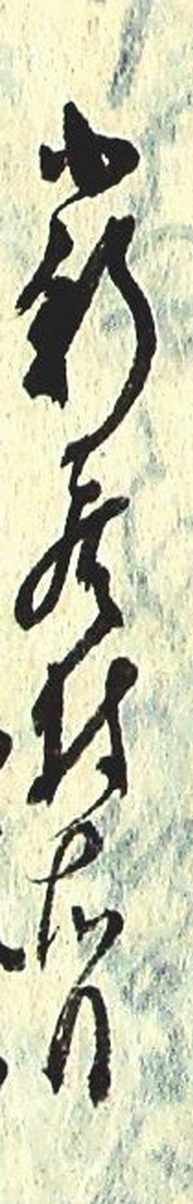北新居村右同
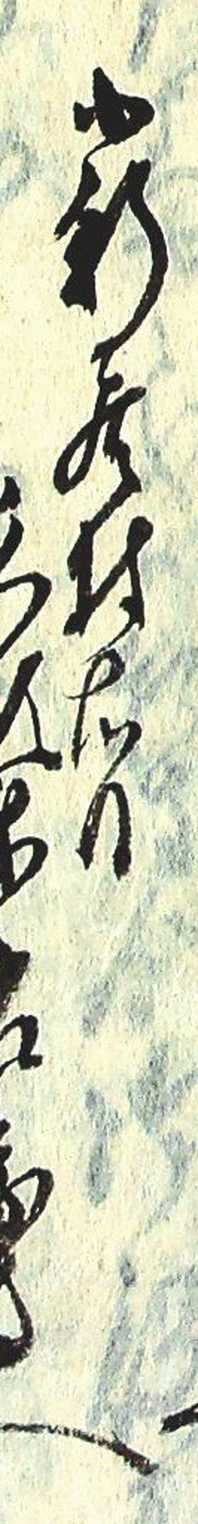北新居村右同
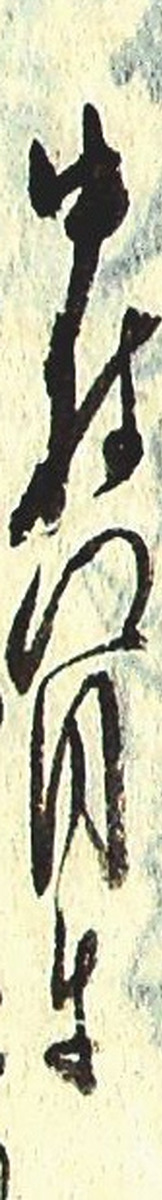中村郷目付
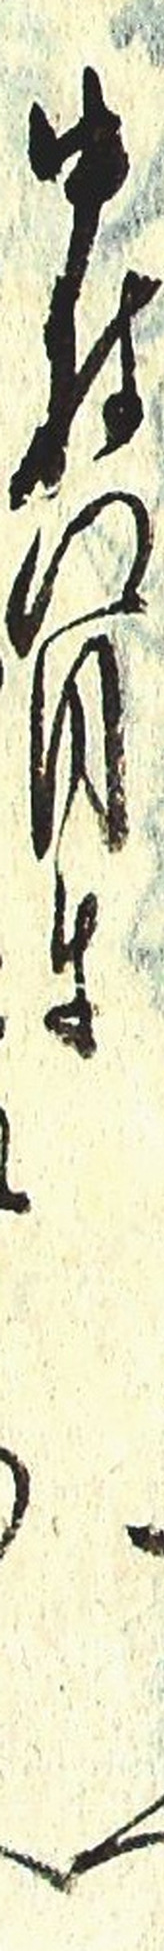中村郷目付
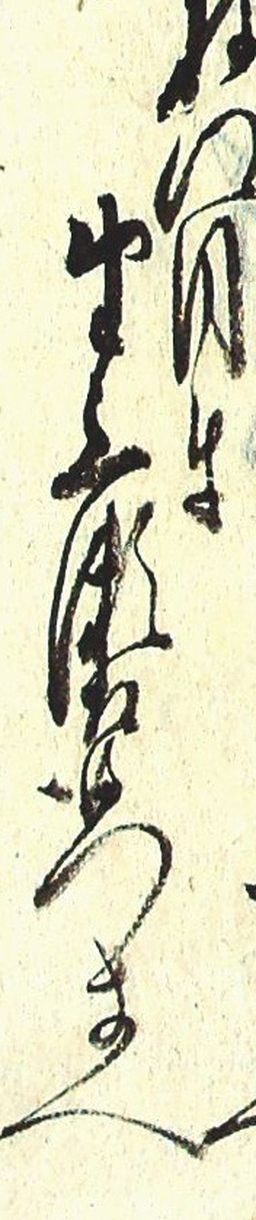野上瀬左衛門方へ

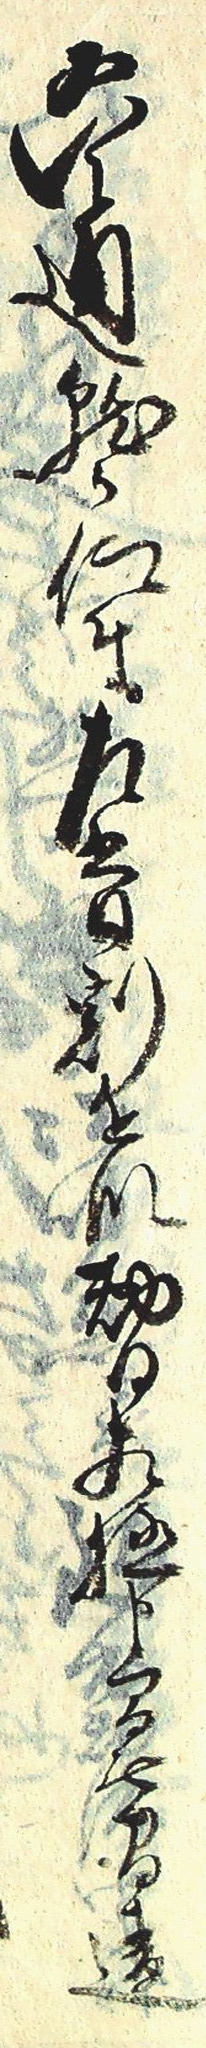右之通就被仰付左書日割を以勤日相極申間無間違
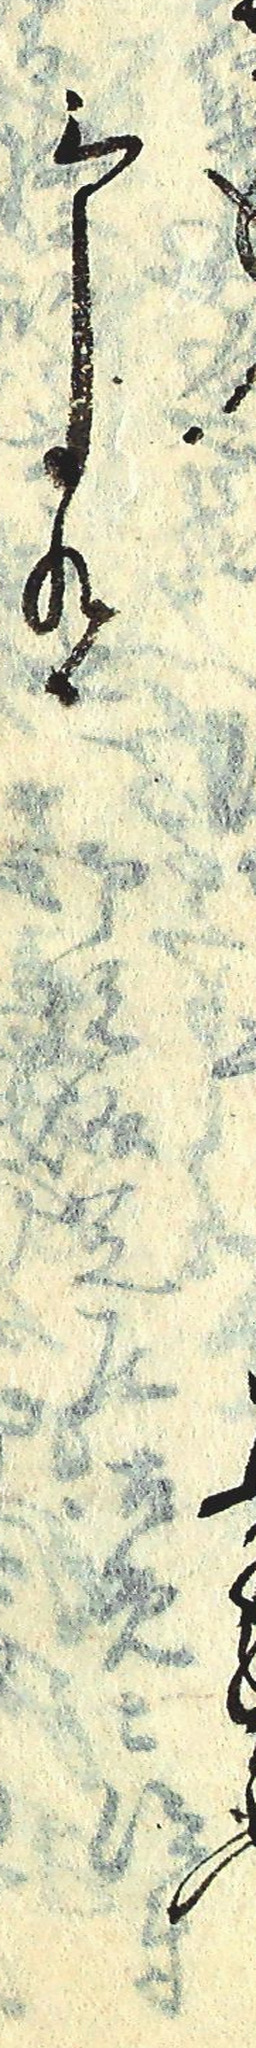三月九日
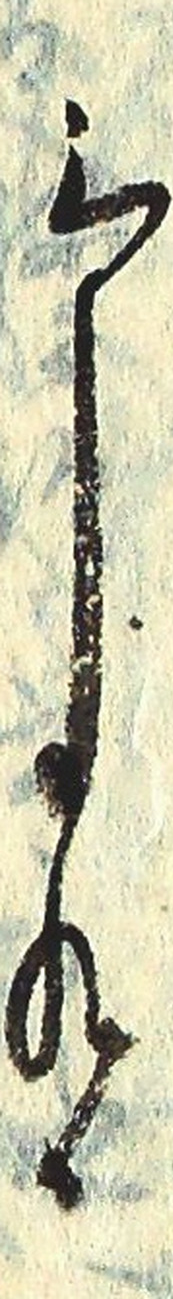三月九日
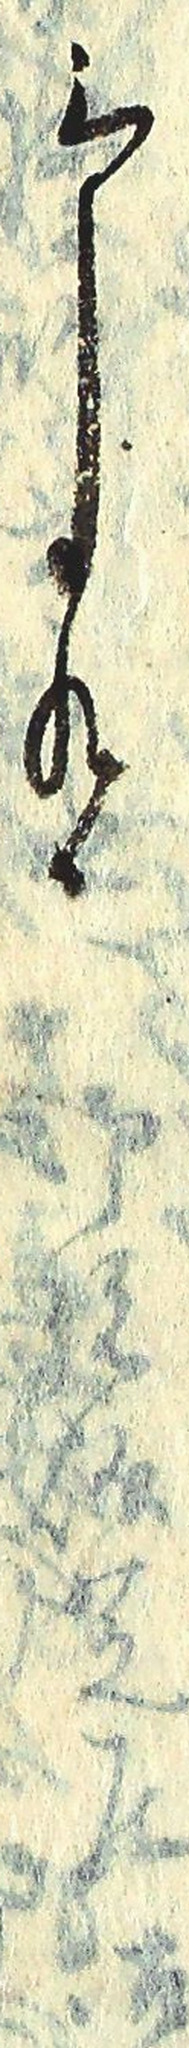三月九日
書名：諸御願書控(弐番）
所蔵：鳴門教育大学 Naruto University of Education
